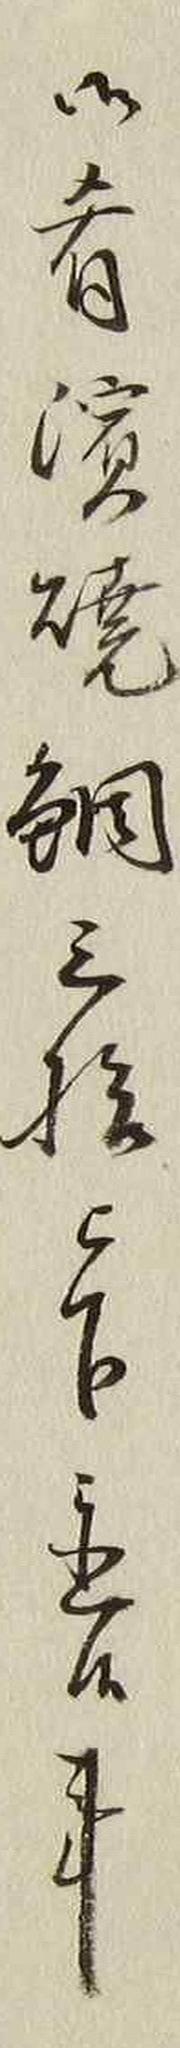御肴浜焼鯛三拾被下置候事
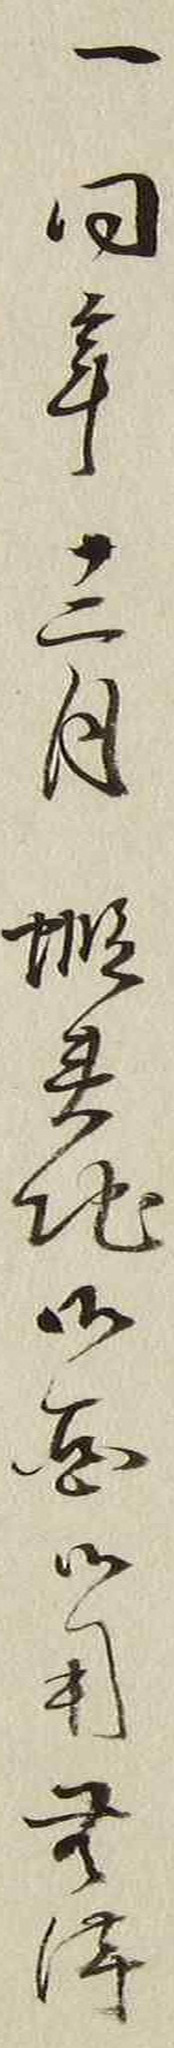一同年十二月蝦夷地御国御用無滞
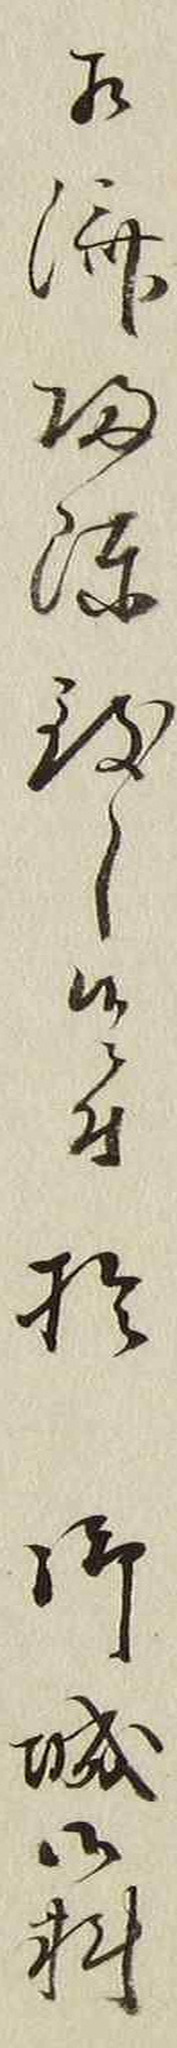相済帰陣致候に付於御城御料
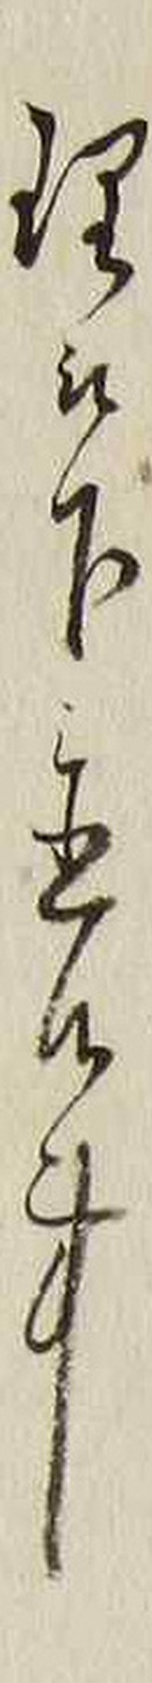理被下候事
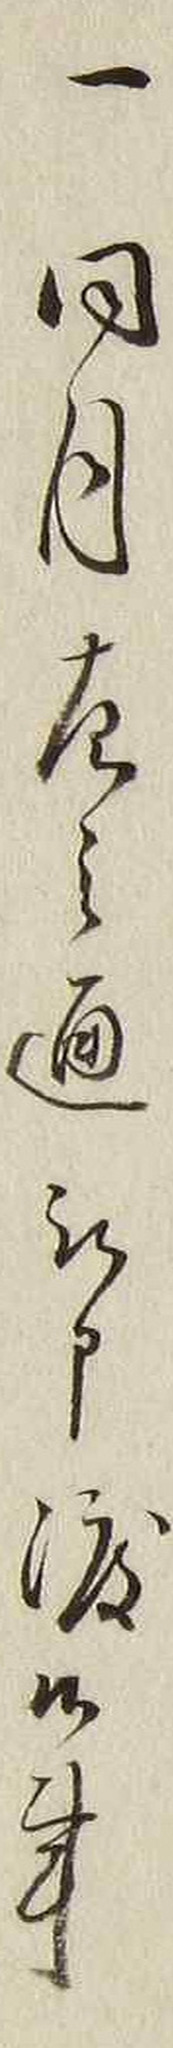一同月左之通被申渡御事
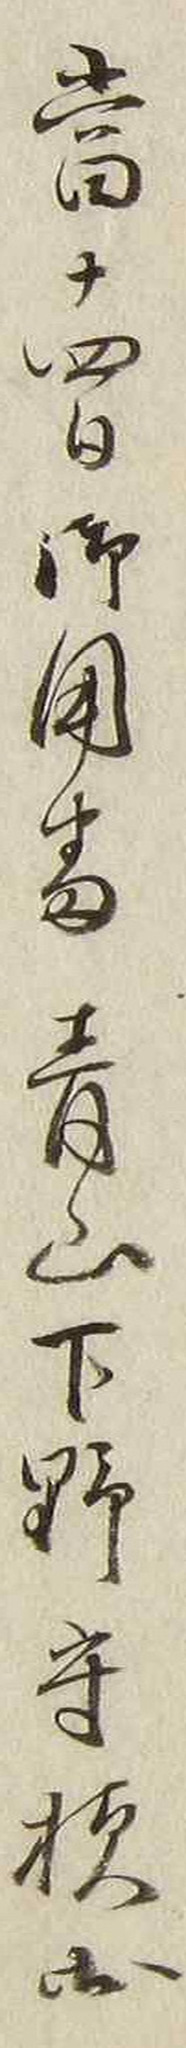当十四日御用番青山下野守様御

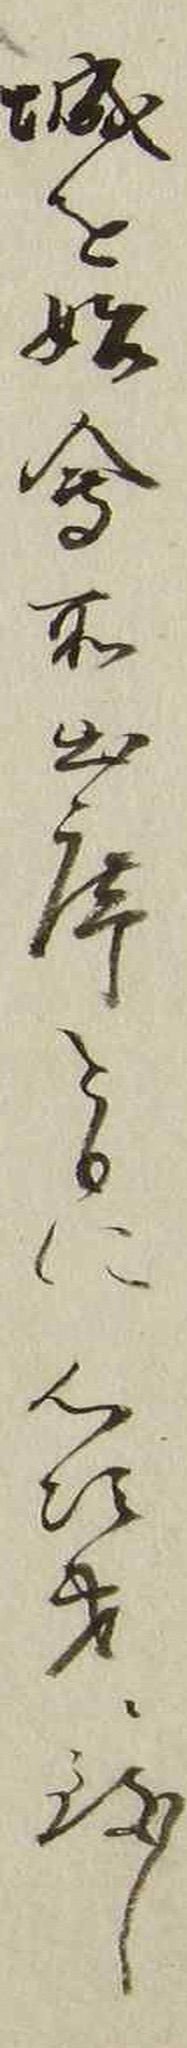城を始会所出席ともに心次第に致し
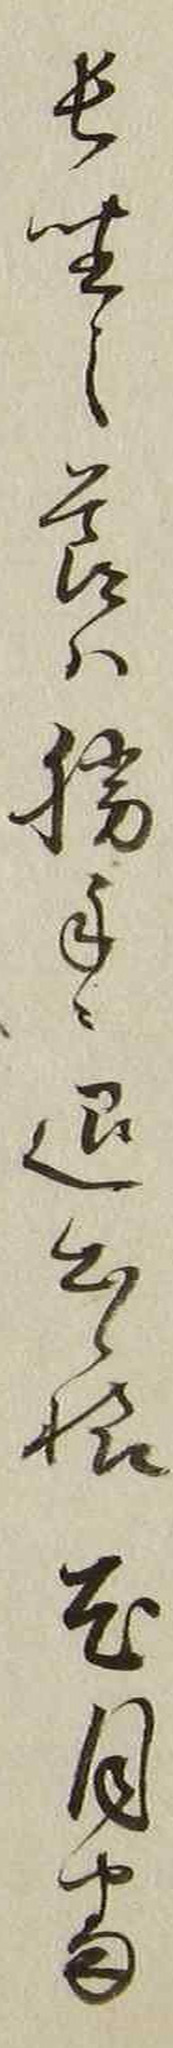長咄之節は勝手に退出候様尤月番
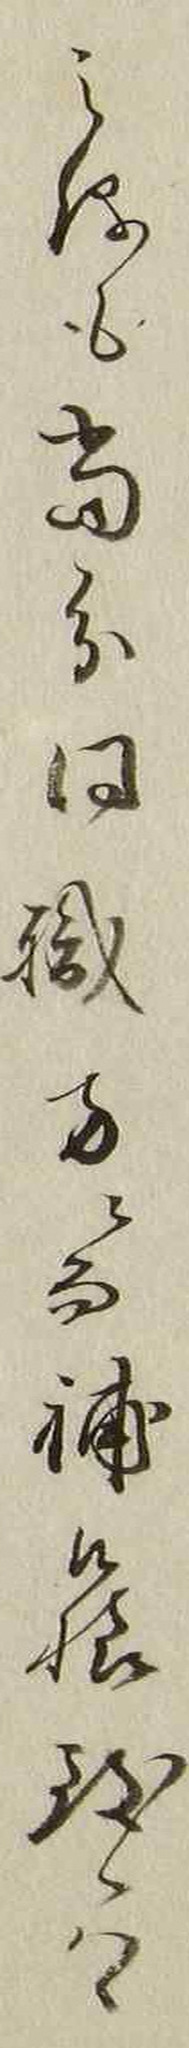之儀も当分同職方に而補候様致候はゝ
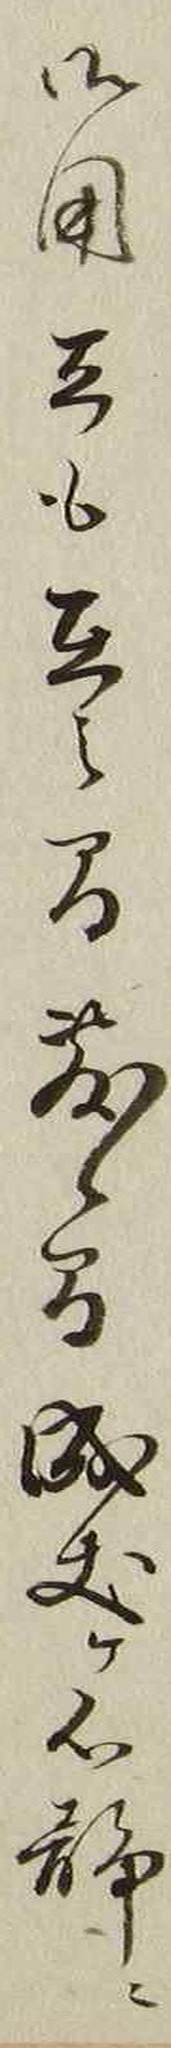御用互も在之間敷候間成丈ヶ心静に
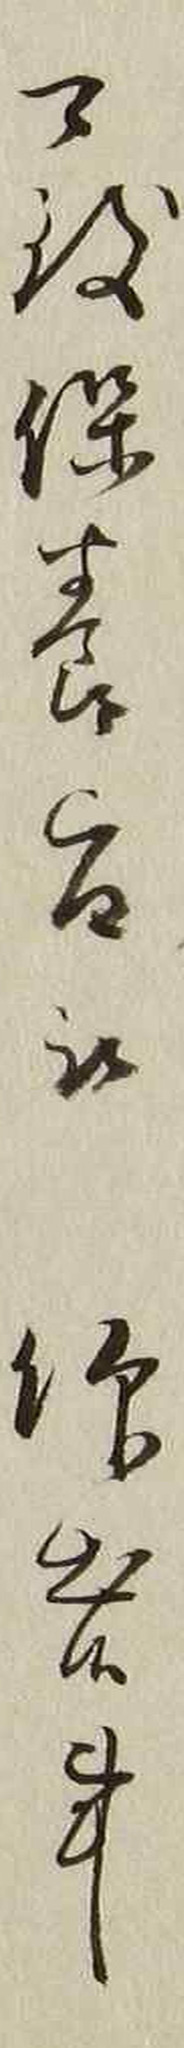可致保養旨被仰出候事
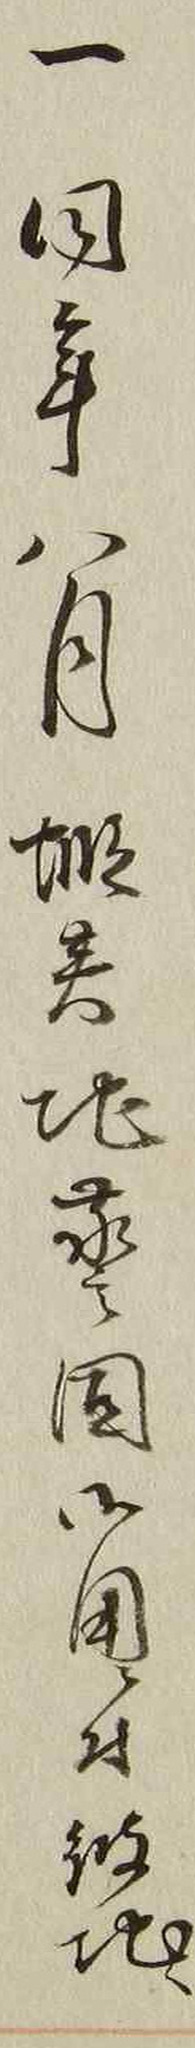一同年八月蝦夷地我ら固御用に付彼地へ
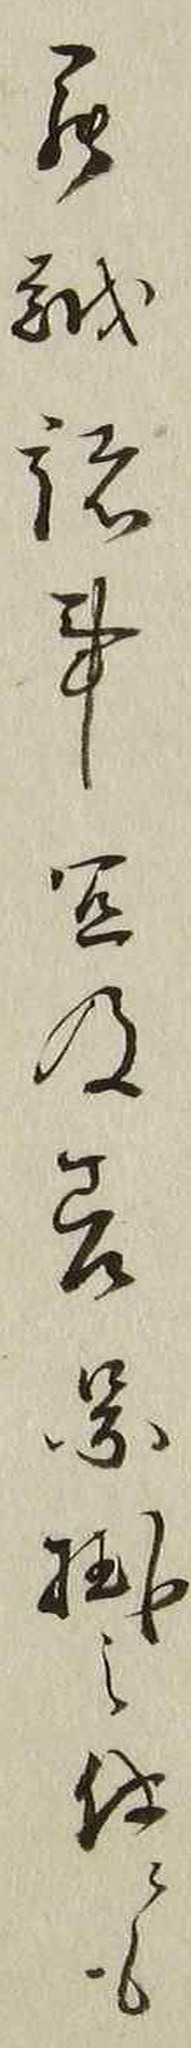罷越諸事宜及差図掛之儀にも
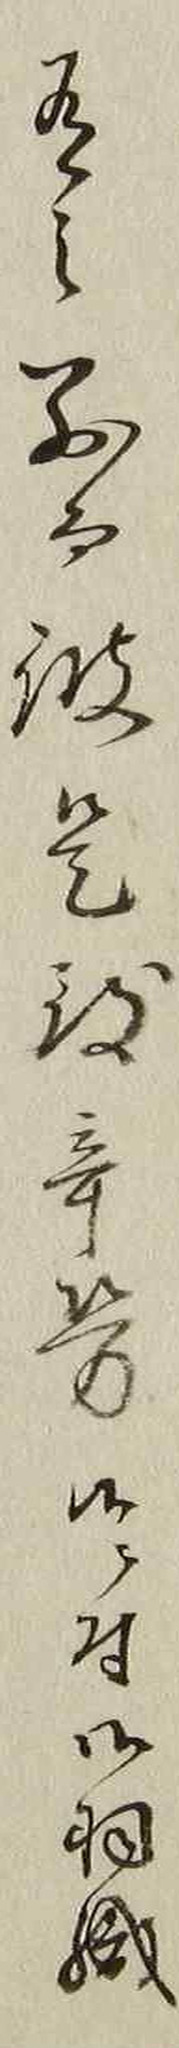有之別而彼是致辛労候に付御羽織
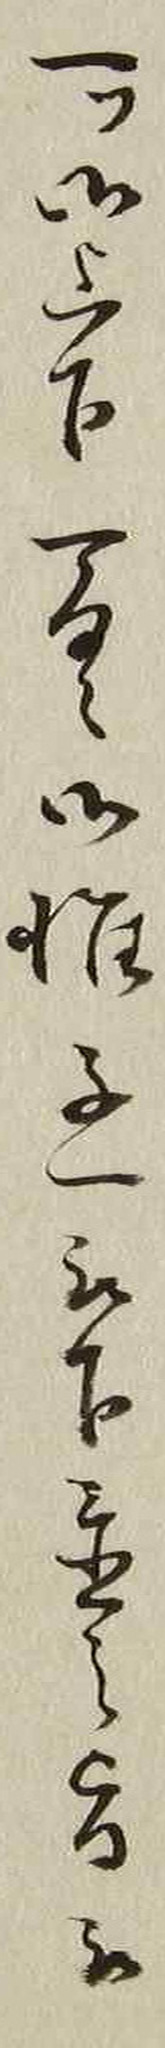一つ御上下一具御帷子一被下置之旨被
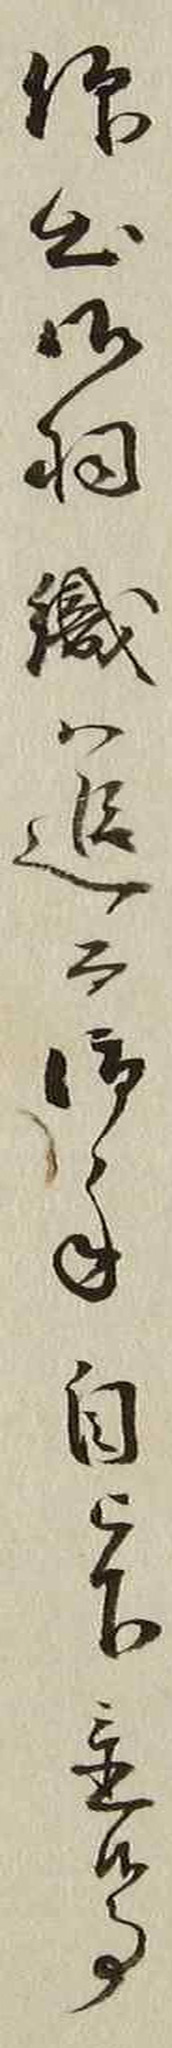仰出御羽織は追而御手自被下置候事
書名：諸士系譜　巻之159　な之部1
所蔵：会津若松市立会津図書館
